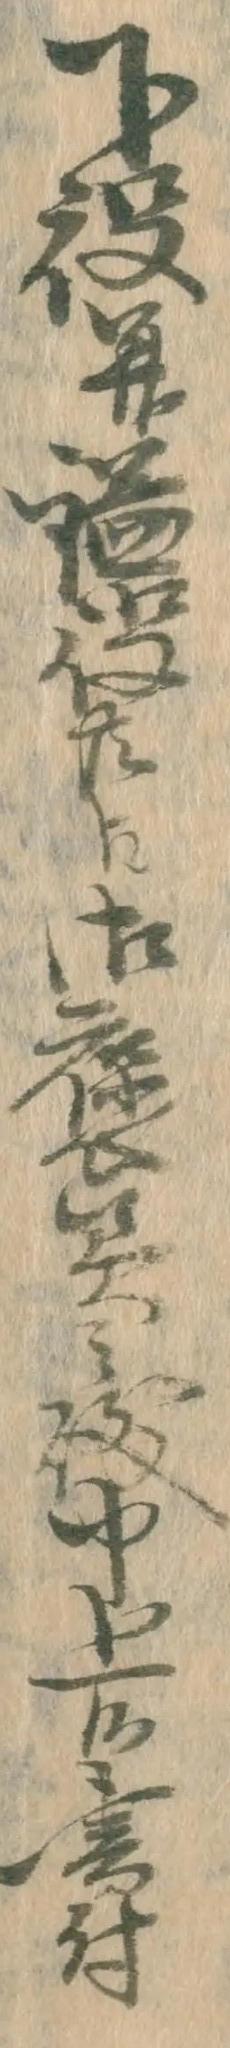│下役幷鎰役共え御褒美之儀申上候書付
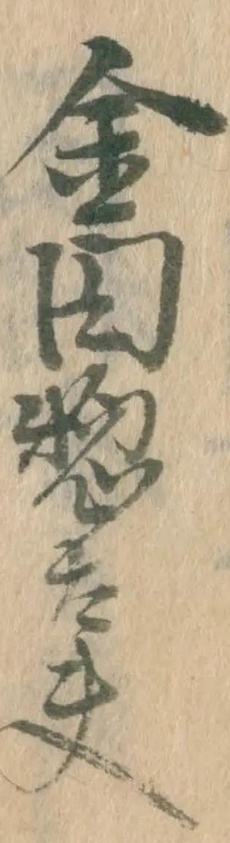金田惣太夫
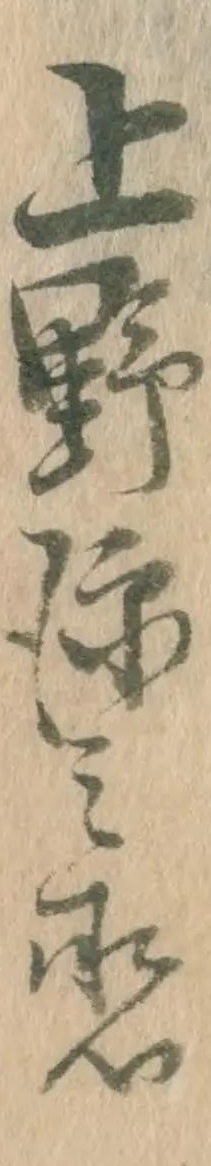上野源之丞

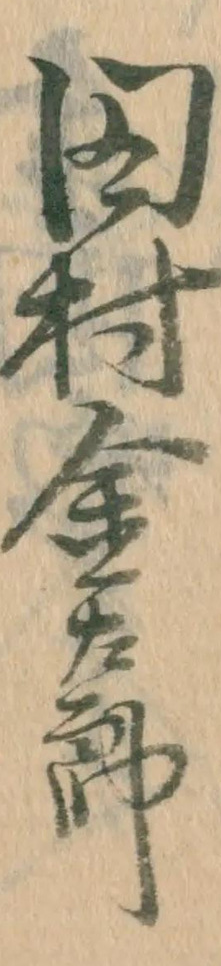田村金太郎
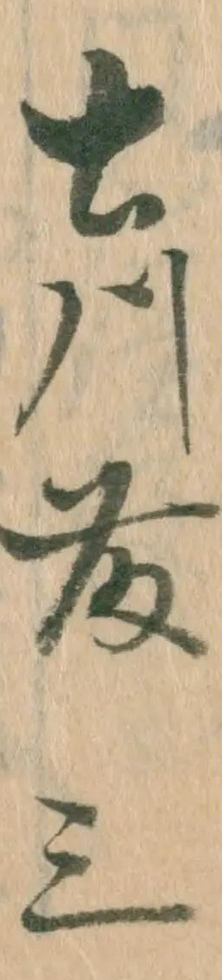大川藤三
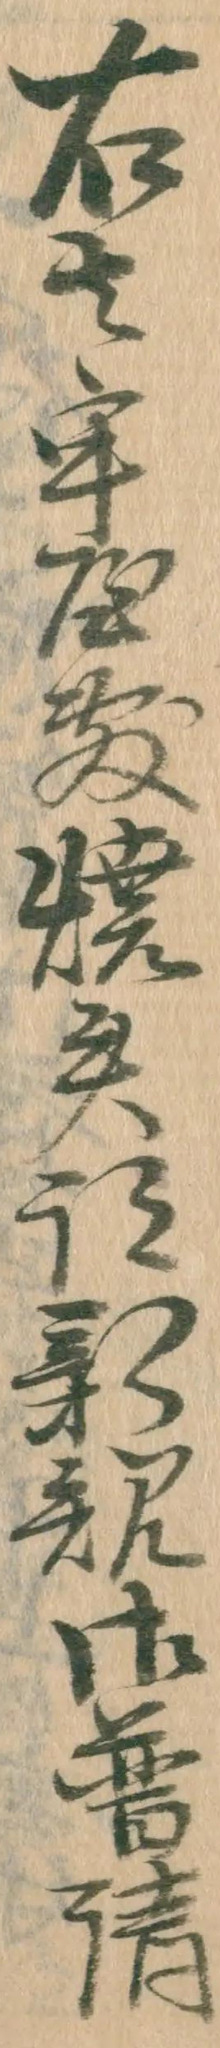右は牢屋舗焼失跡新規御普請
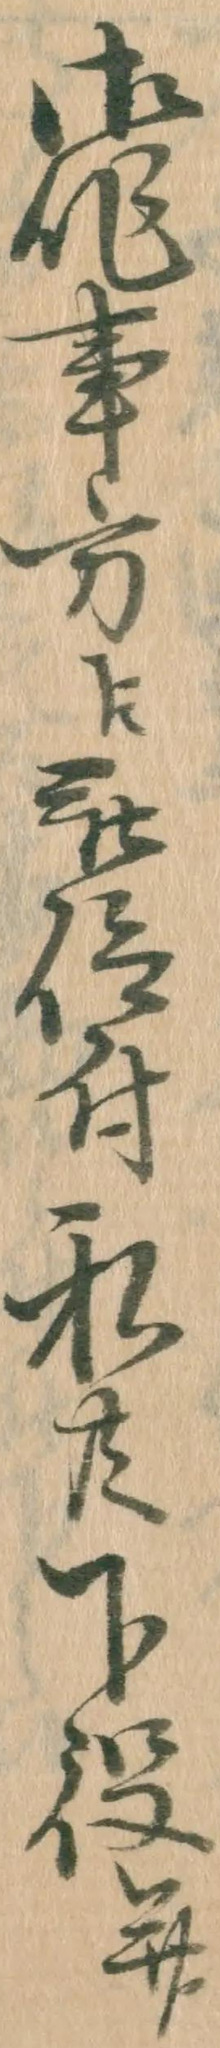御作事方え被仰付私共下役幷
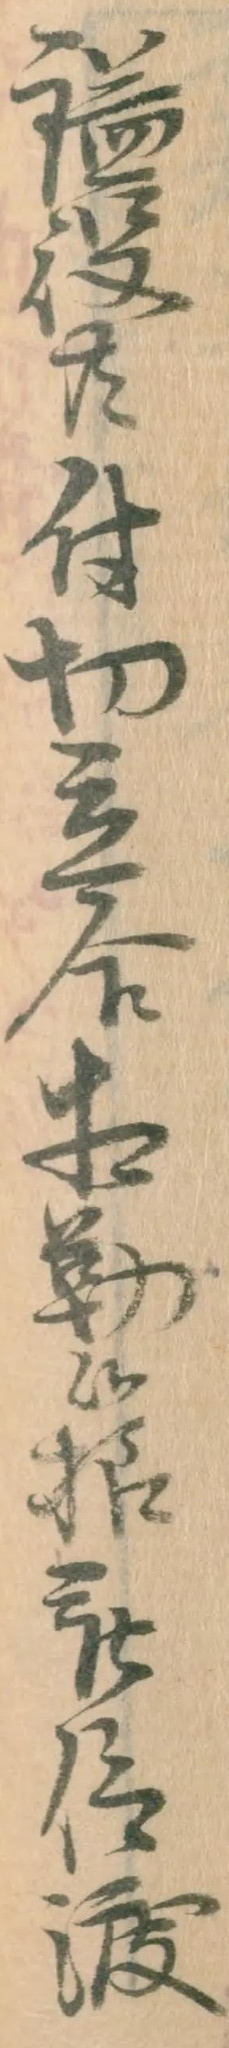鎰役共付切立合相勤候様被仰渡
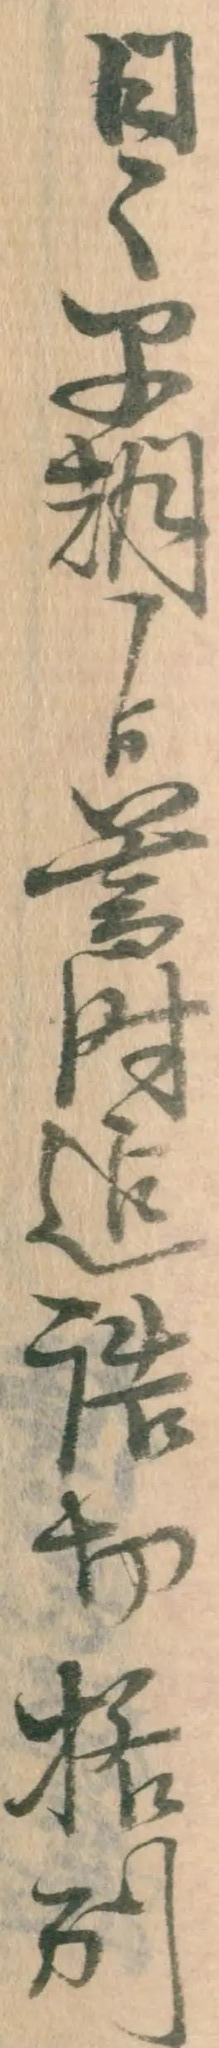日〻早朝ゟ暮時迄詰切格別
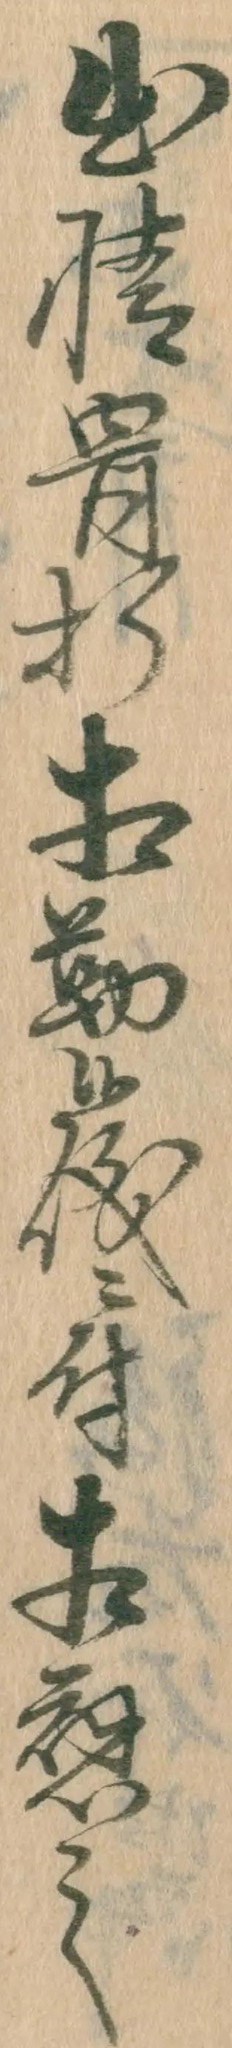出情骨折相勤候儀ニ付相応之
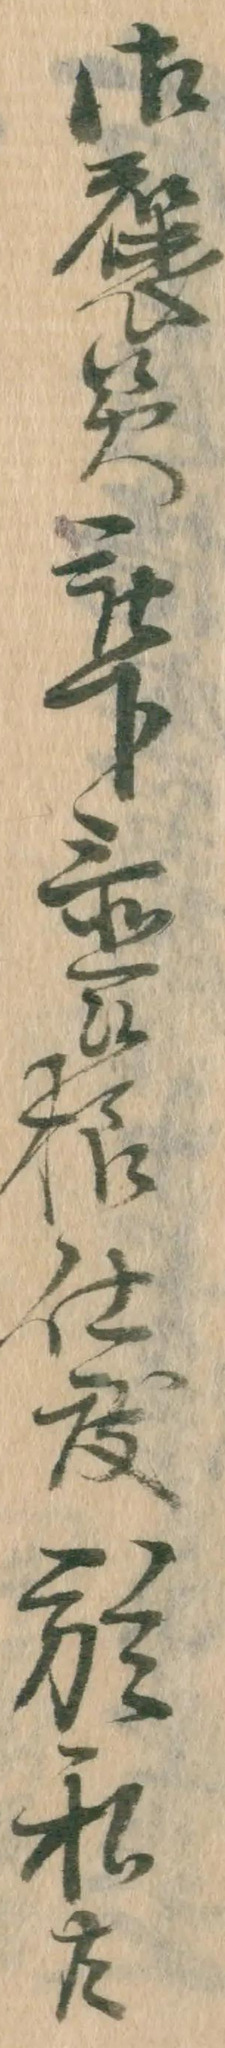御褒美被下置候様仕度於私共
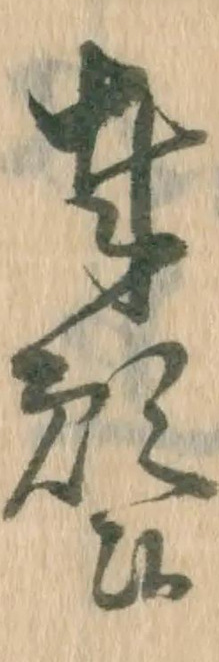奉願候

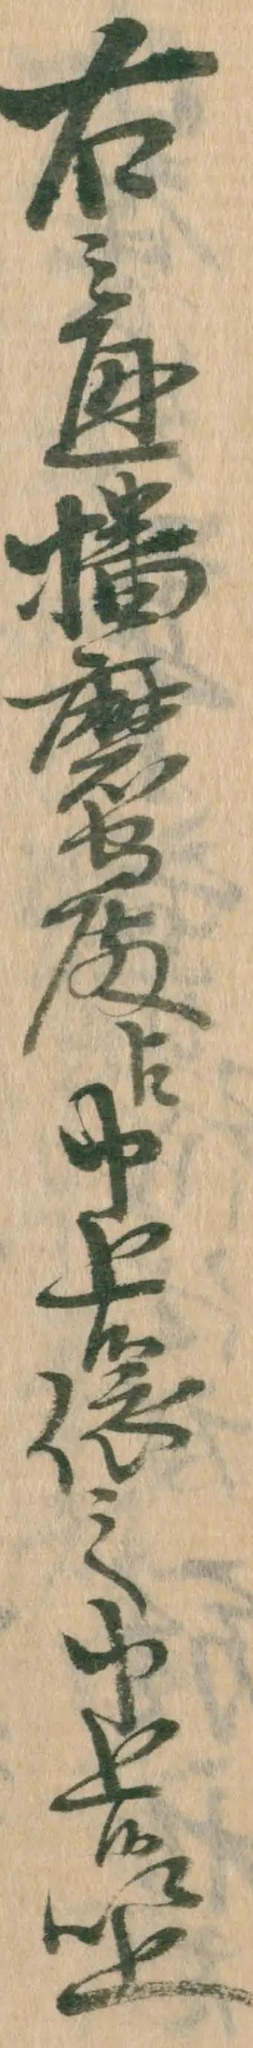右之通播磨守殿え申上候依之申上候以上
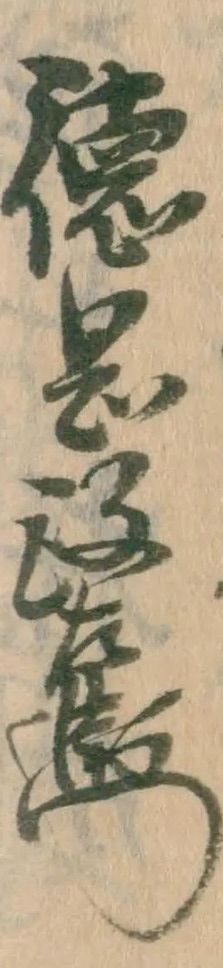徳岡政左衛門
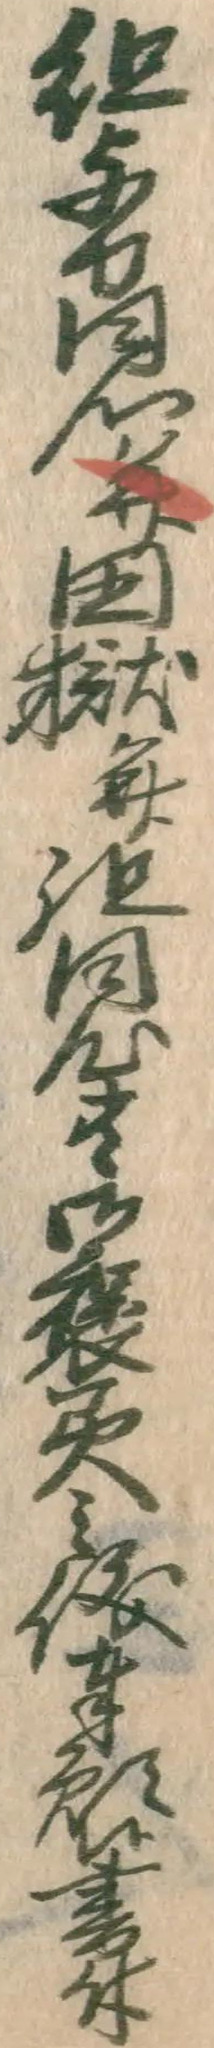│組与力同心幷囚獄幷組同心共御褒美之儀奉願候書付
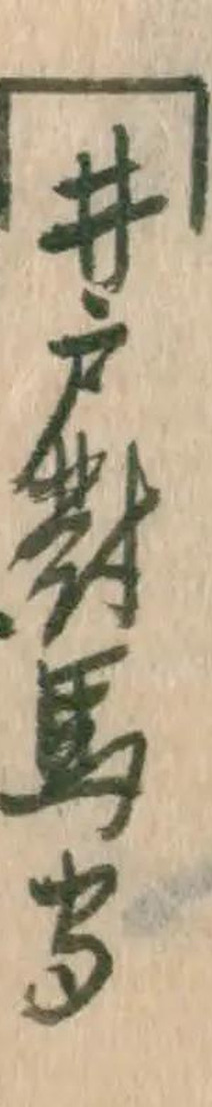│[井戸対馬守
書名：七十冊物類集 71巻. [44] 四十三 牢屋敷御普請御修覆地震ニ付骨折候牢屋掛御褒美之部
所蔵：国立国会図書館 National Diet Library, JAPAN
